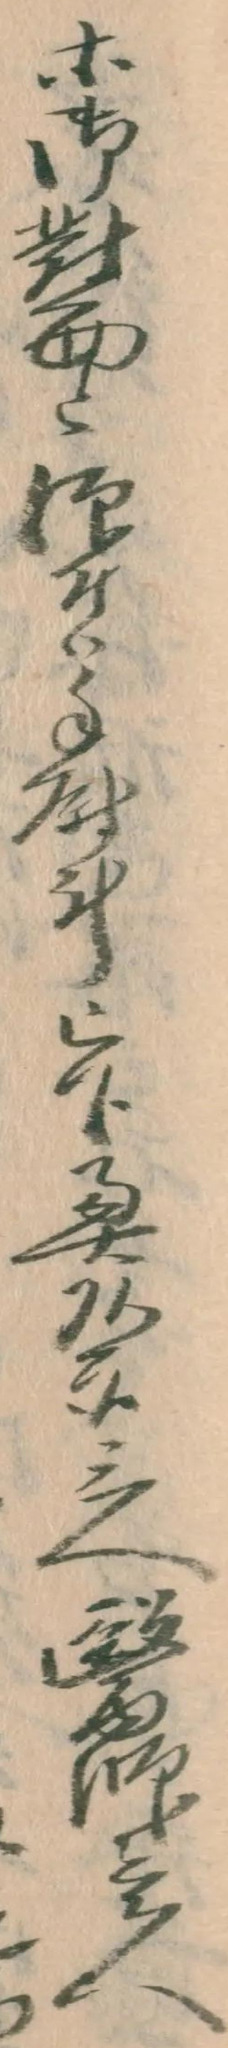等御對面被仰付御手熨斗被下奥頭取三人医師壱人
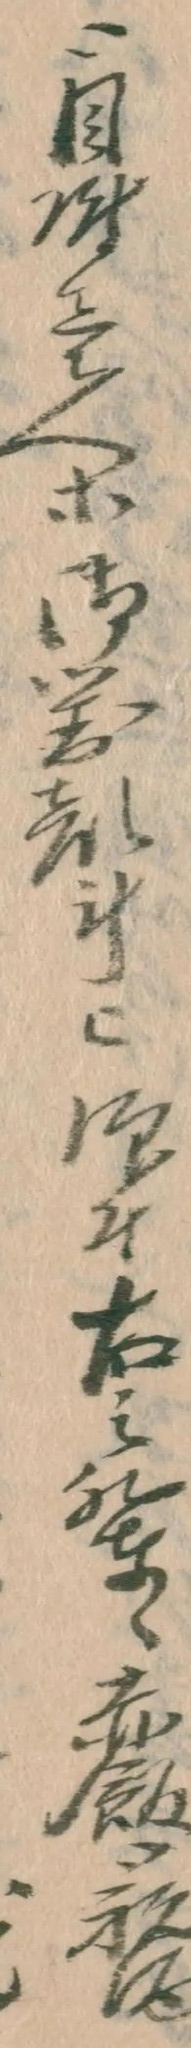ニ目附壱人等御對顔斗被仰付右之輩ヘ赤飯御祝酒
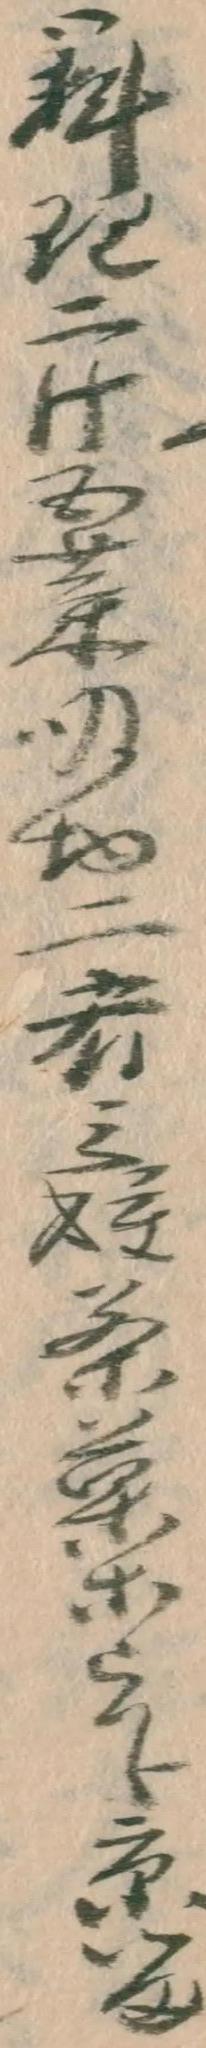御料理二汁五菜吸物二肴三種茶菓等被下京留
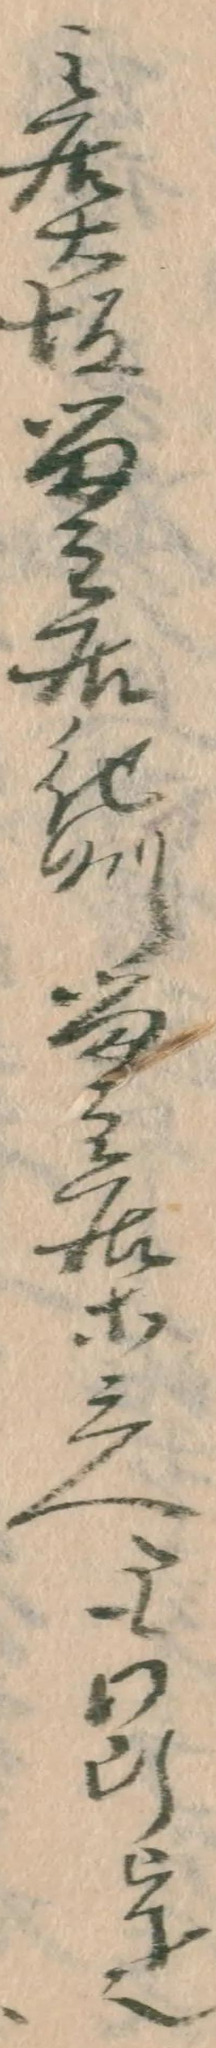之居大坂留守居紀州留主居等三人とも同断被下也
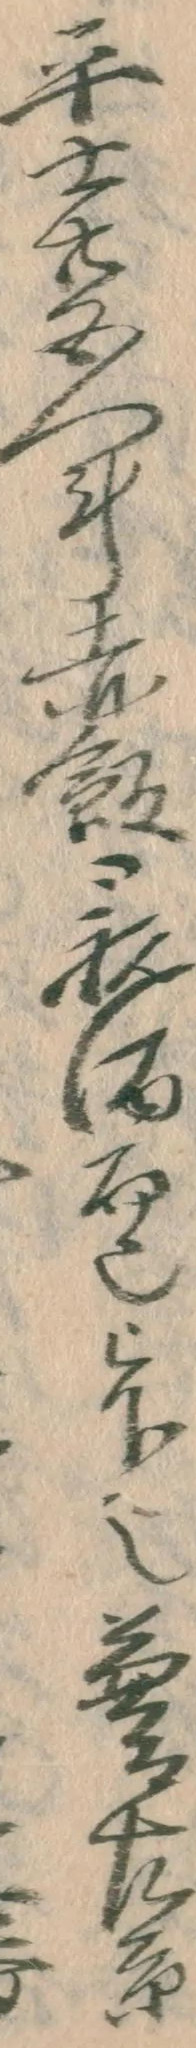平士廿五人斗赤飯御祝酒百疋被下也兼而左京
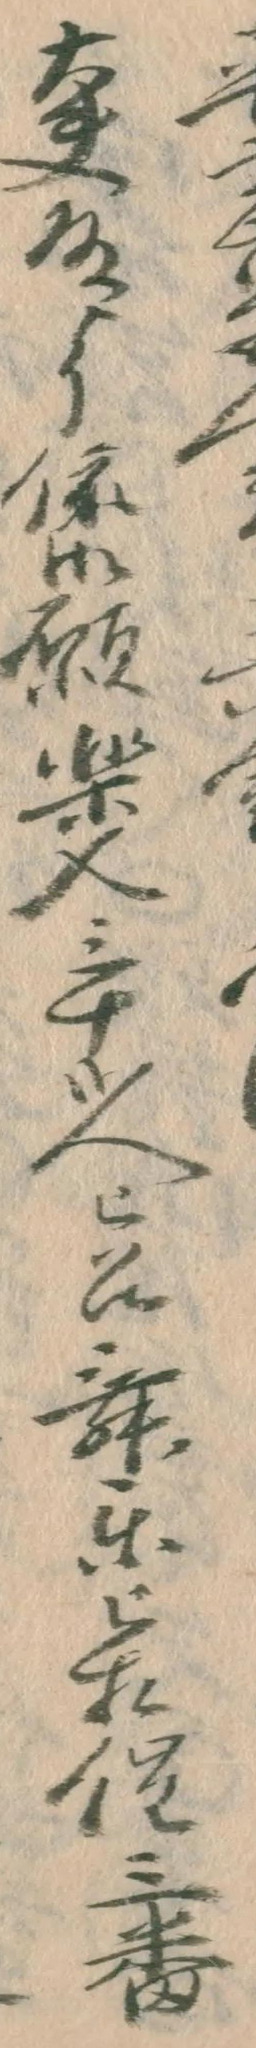大夫殿より俄御願楽入三十弐人被召舞楽被相催三番
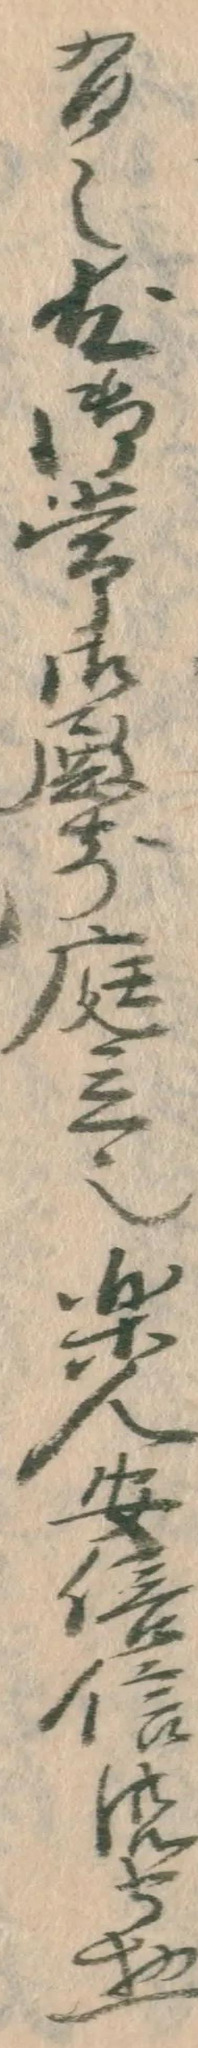有之尤御常御殿前庭立之楽人安倍信濃守惣
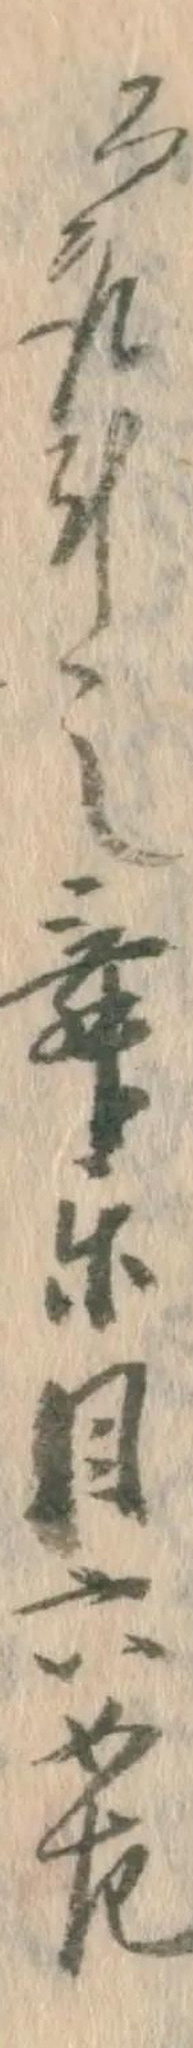而取斗也御舞楽目六如左
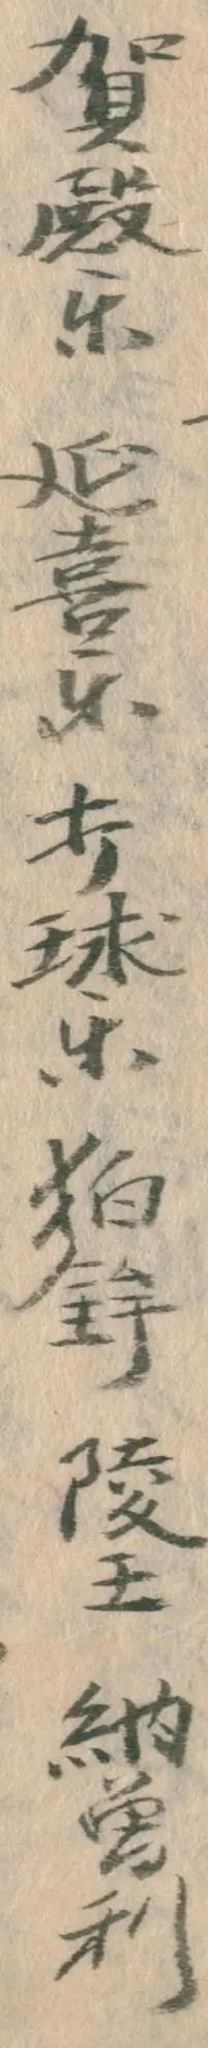賀殿楽延喜楽打球楽狛飾陵王納曽利
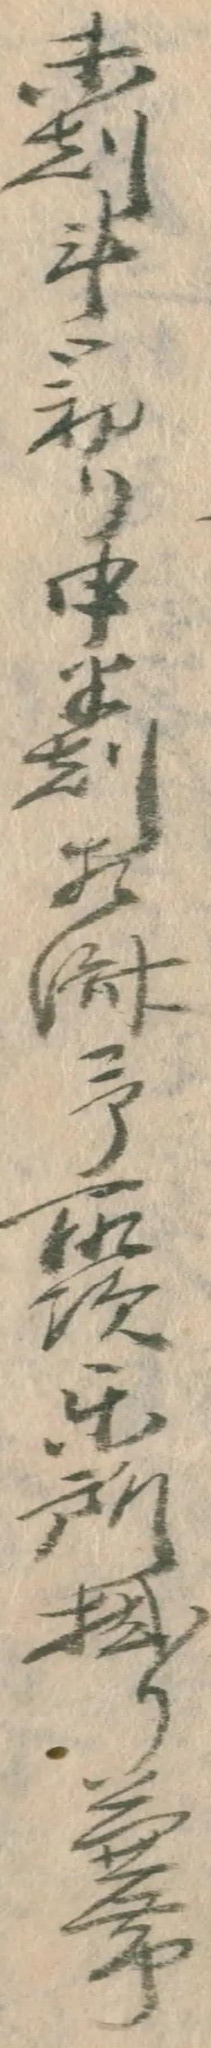未刻斗御初り申半刻相済予取次楽所掛り兼帯
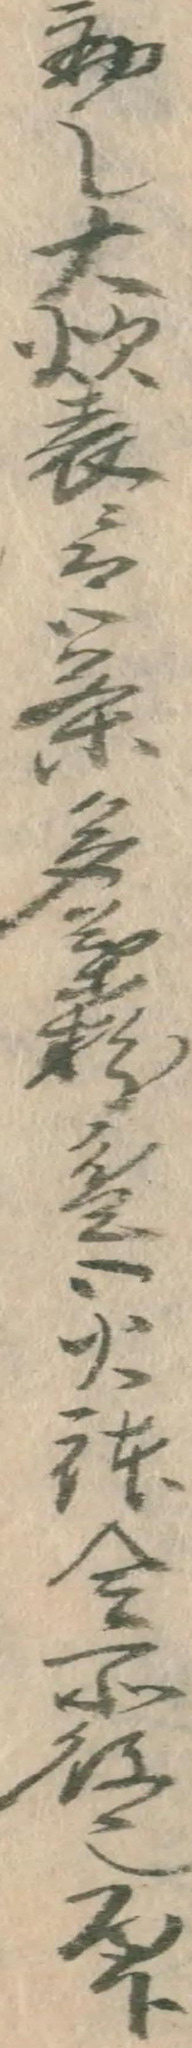動也大炊表ニ而御茶多葉粉盆御火鉢令所役也酉下
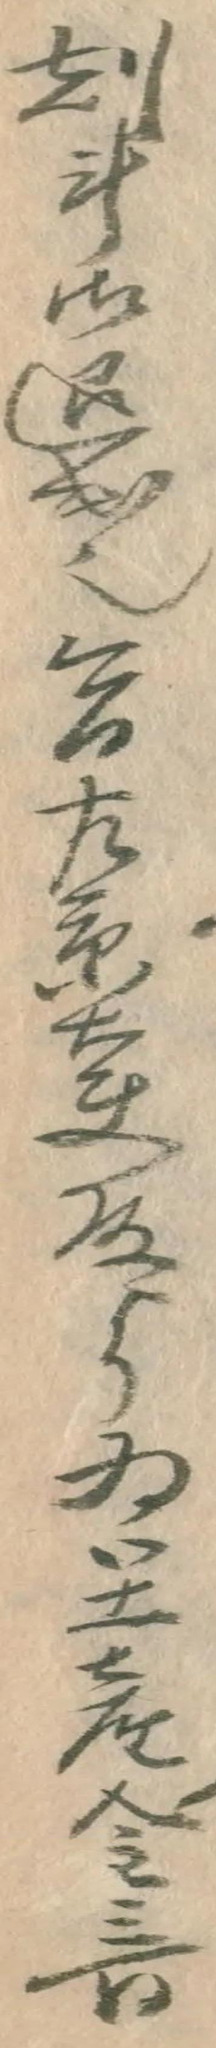刻斗御退出也今日左京大夫殿より為御土産金三百

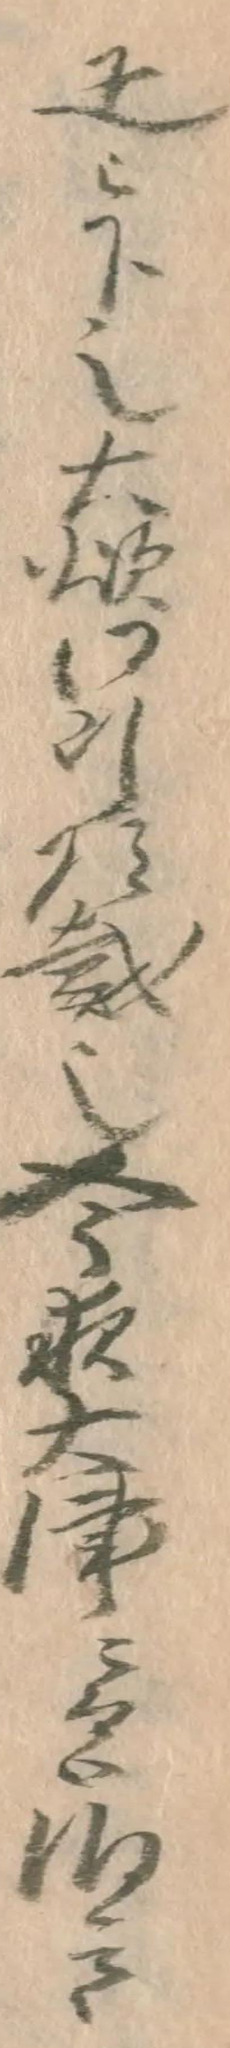疋被下之大炊同断頂戴也今夜大津ニ而御泊云々
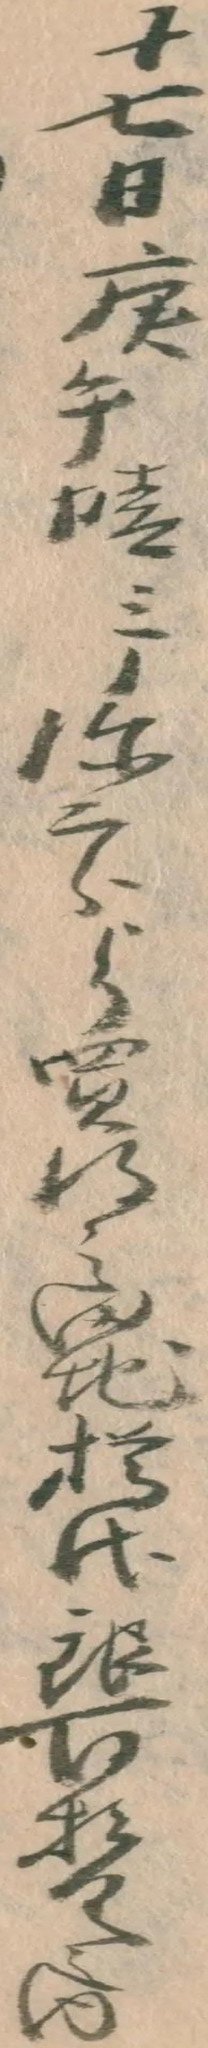十七日庚午晴三ノ弥二郎より買持之田地樽代銀百拾匁之内
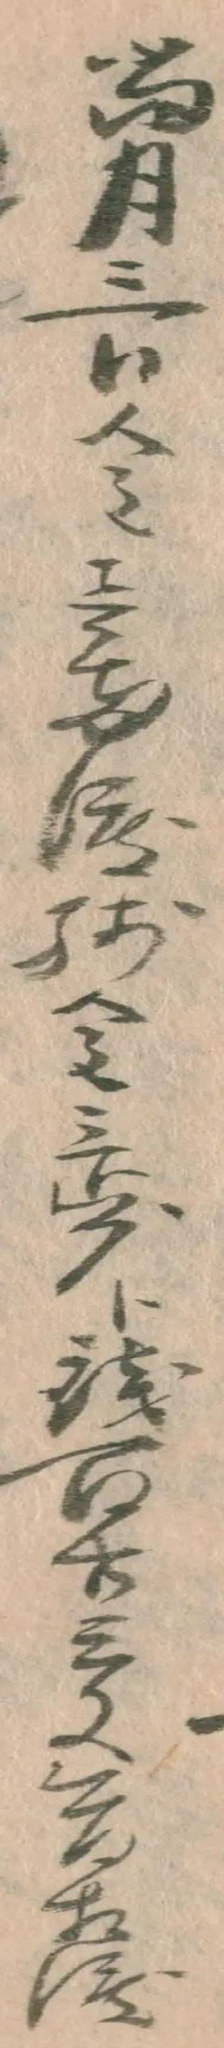當月三日金壱両渡残金三歩ト銭百廿三文今日相渡
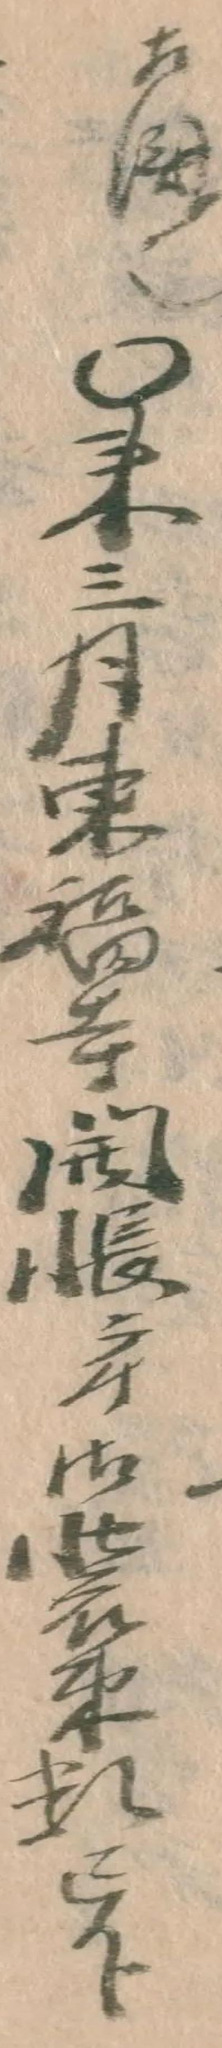相済也〇来三月東福寺開帳ニ付御装束類已下
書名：賀茂社記録. 第67冊
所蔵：国立国会図書館 National Diet Library, JAPAN
